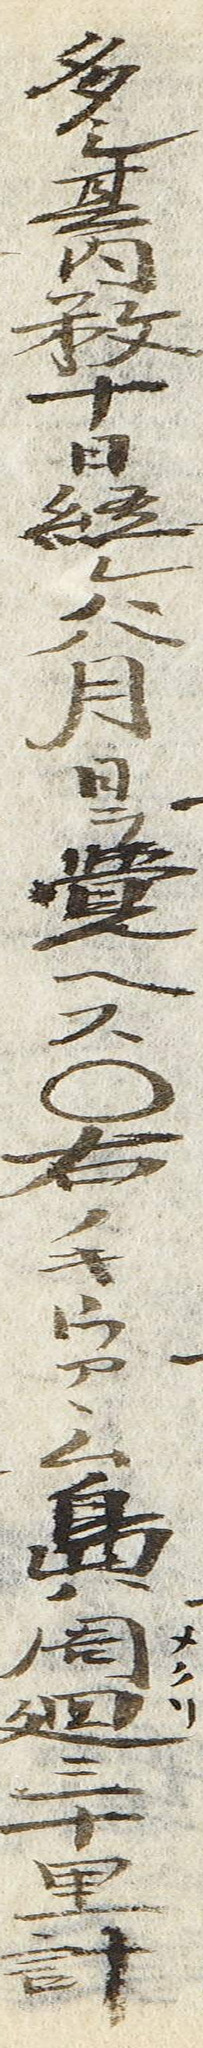多シ其内数十日経レハ八月日ヲ覚へス〇右ノキウアヽム島ハ周廻三十里計
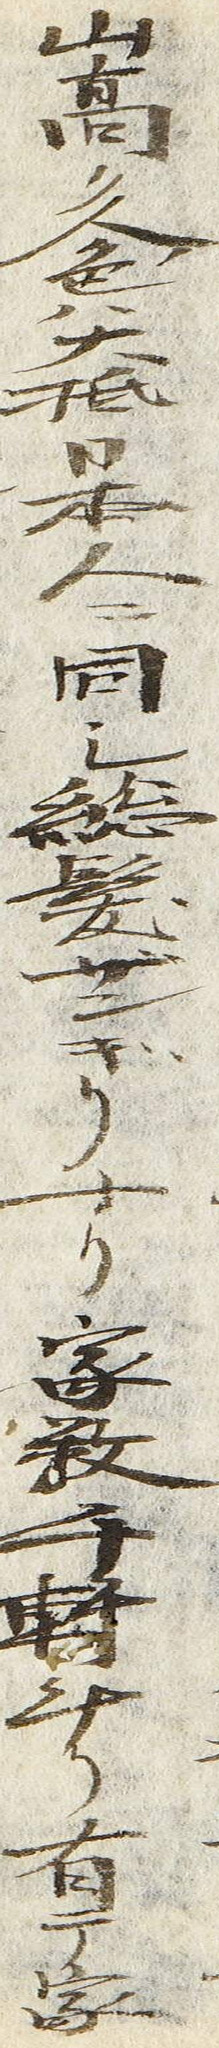山高ク人色ハ大抵日本人ニ同シ総髪ザンギリナリ家数千軒計リ有テ家
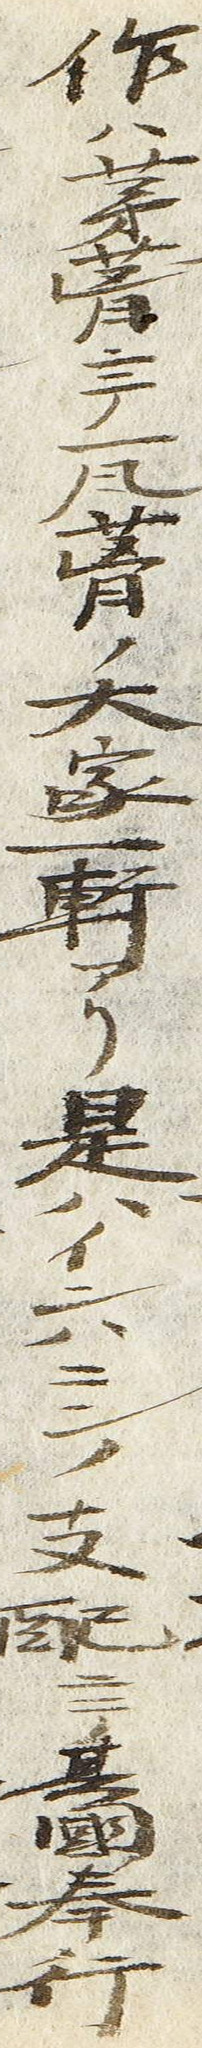作ハ茅葺ニテ瓦葺ノ大家一軒アリ是ハインハニンノ支配ニテ其国奉行
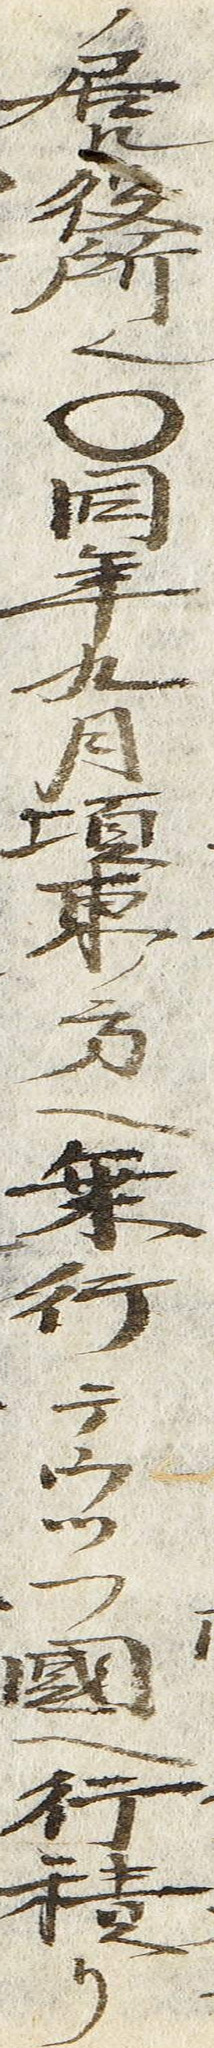ノ居ル役所也〇同年九月頃東ノ方ヘ乗行テウツフ国ヘ行積リ
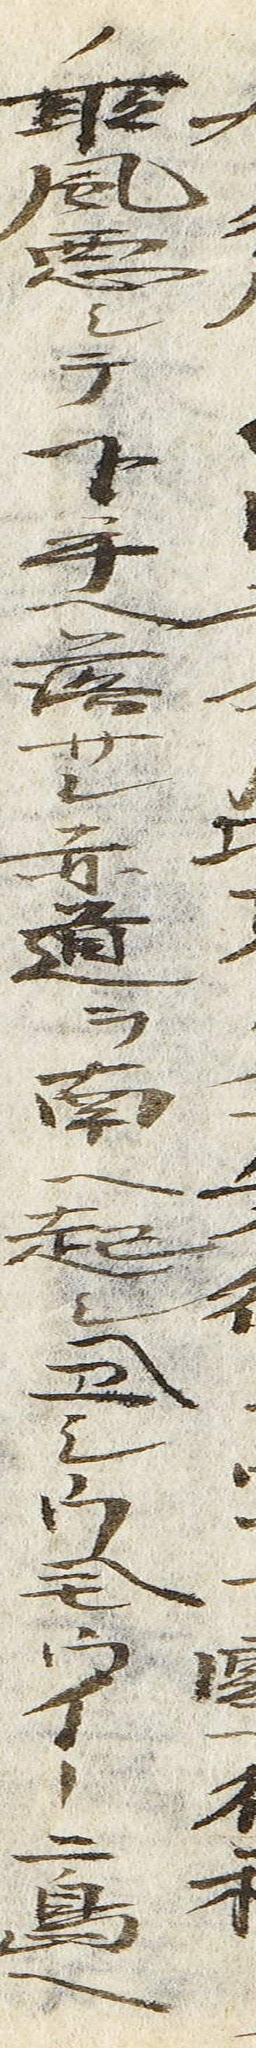ノ所風悪シテ下手ヘ落サレ赤道ヲ南ヘ起シエシウモウイーニ島ヘ
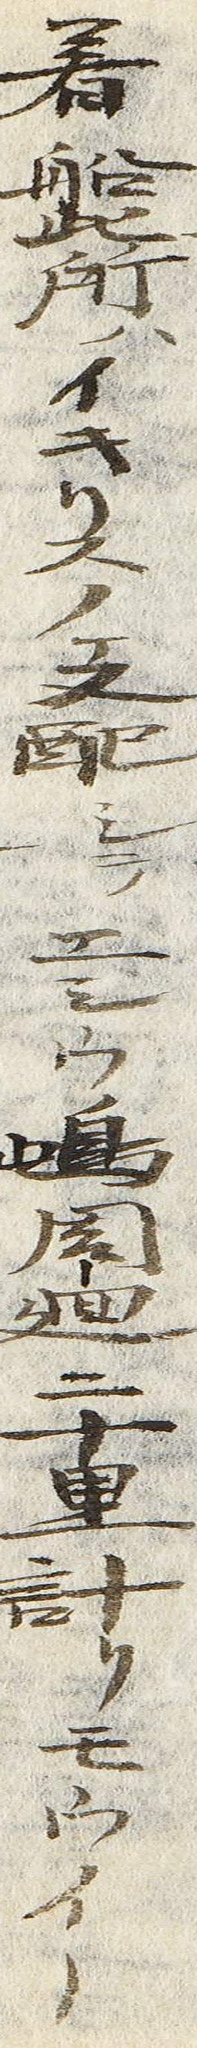着船此所ハイキリスノ支配シテエシウ嶋周廻二十里計リモウイー
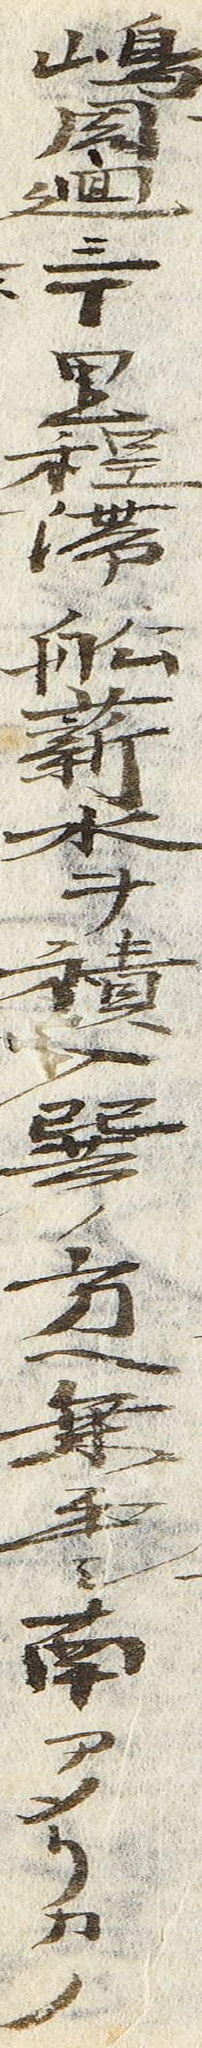嶋周廻三十里程滞船薪水ヲ積入巽ノ方ヘ乗出シ南アメリカノ
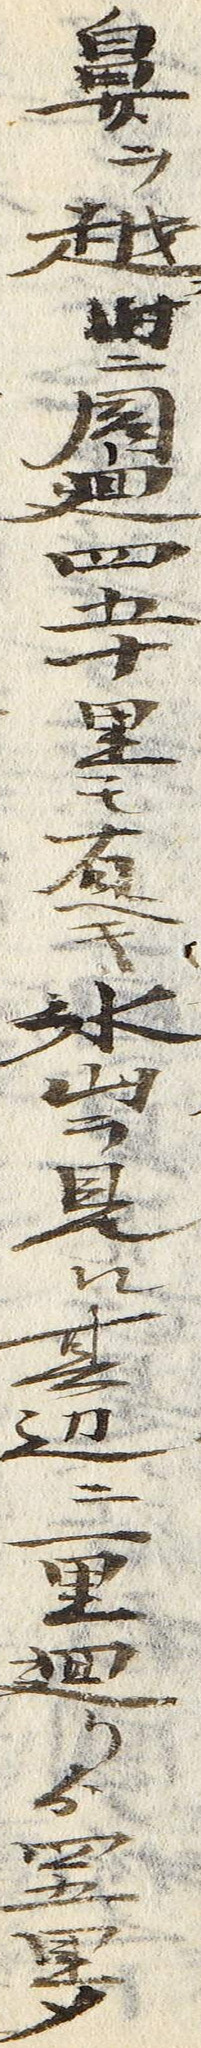鼻ヲ越ス時ニ周廻四五十里モ有ヘキ氷山ヲ見ル其辺ニ一里廻リゟ四五里〆
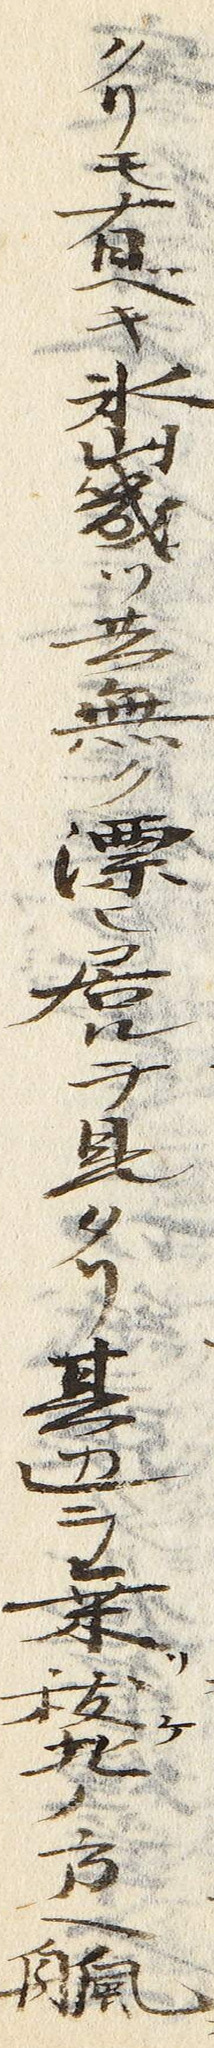タリモ有ベキ氷山幾ツ共無ク漂ヒ居ルヲ見タリ其辺ヲ乗リ抜ケ北ノ方へ帆
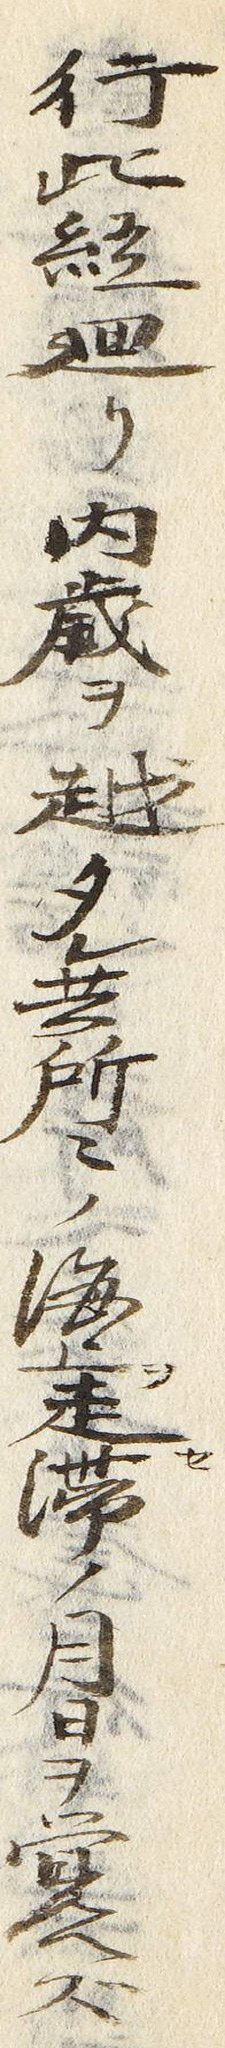行此経廻リ内歳ヲ越タレ共所々ノ海上ヲ走セ滞ノ月日ヲ覚ヘズ
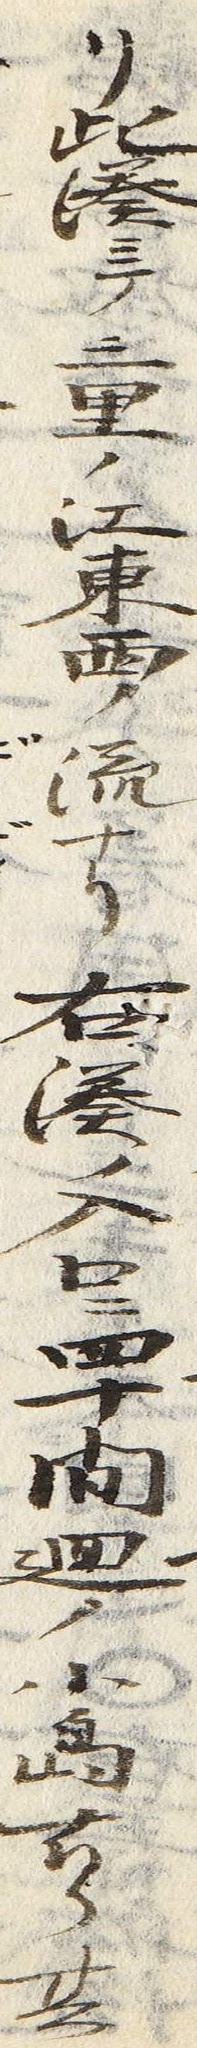リ此湊ニテ三里ノ江東西ノ流ナリ右湊ノ入口ニ四十間廻ノ小島有リ其
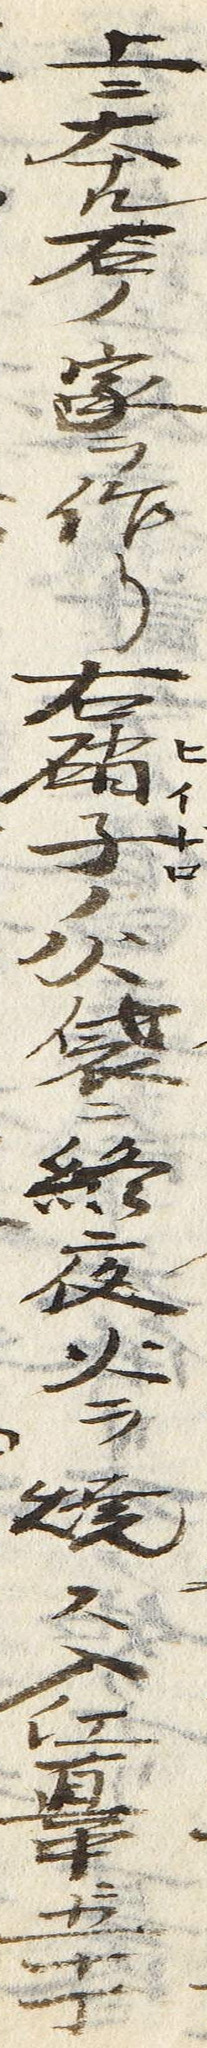上ニ大ナル石ノ家ヲ作リ右硝子ノ火袋ニ終夜火ヲ焼ス入江真中ニ五十丁
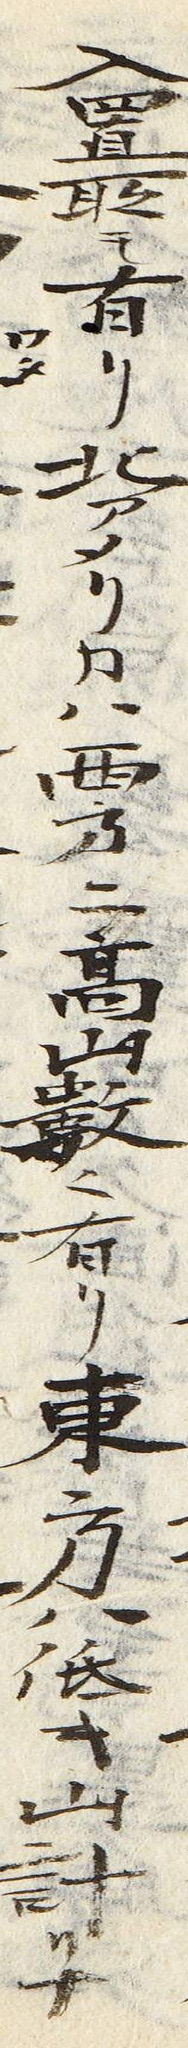入置所モ有リ北アメリカハ西方ニ高山数々有リ東方ハ低キ山計リナ
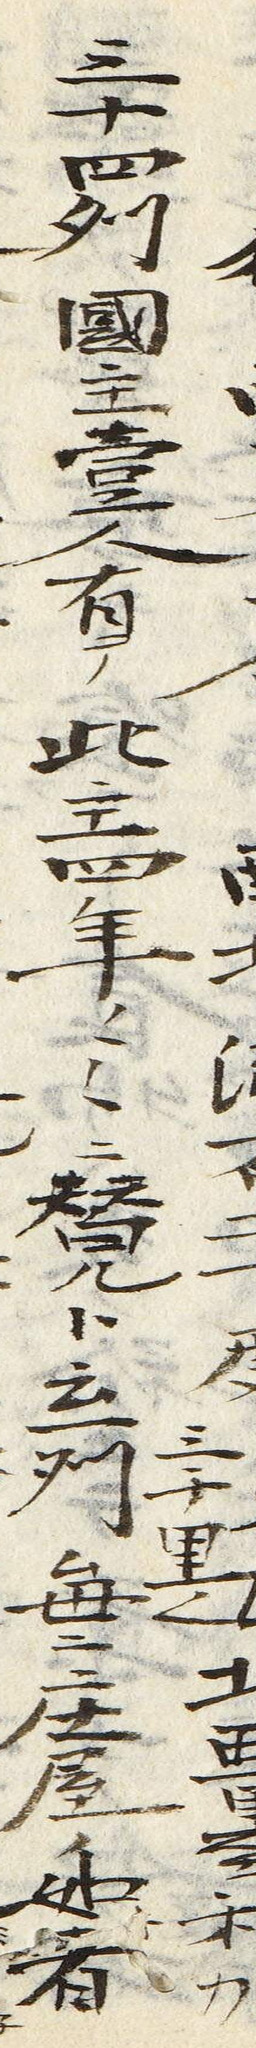三十四州国主壱人有テ此主四年〳〵ニ替ルト云一州毎ニ庄屋ノ如キ者
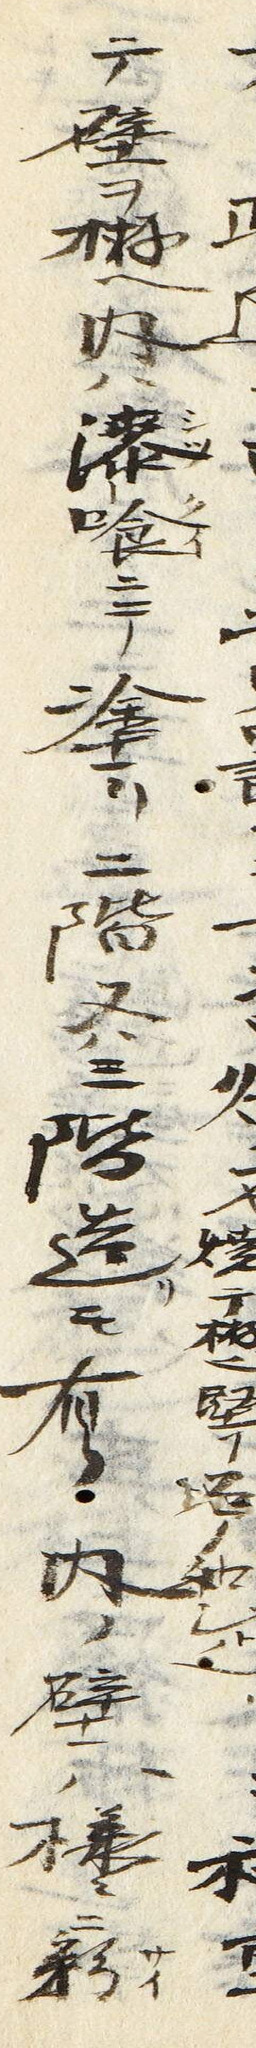テ壁ヲ拵ヘ内ハ漆喰ニテ塗リ二階又ハ三階造リモ有リ内ノ壁ハ様々ニ採

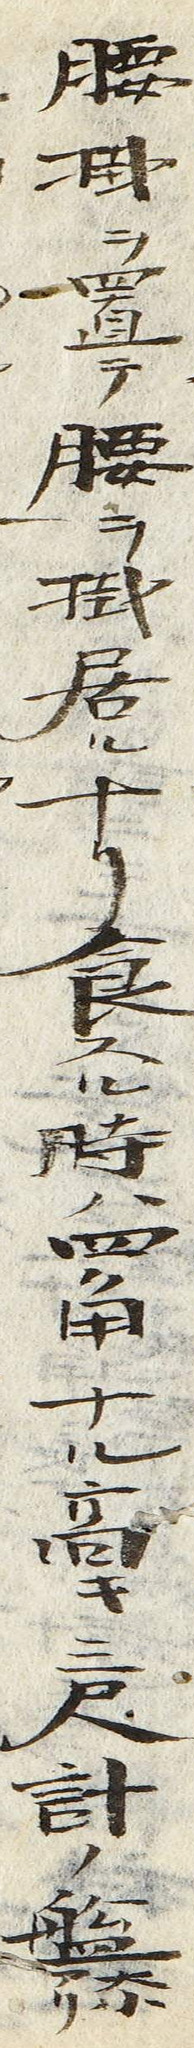腰掛ヲ置テ腰ヲ掛居ルナリ食スル時ハ四角ナル高キ三尺計ノ盤大小アリ
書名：漂流記聞
